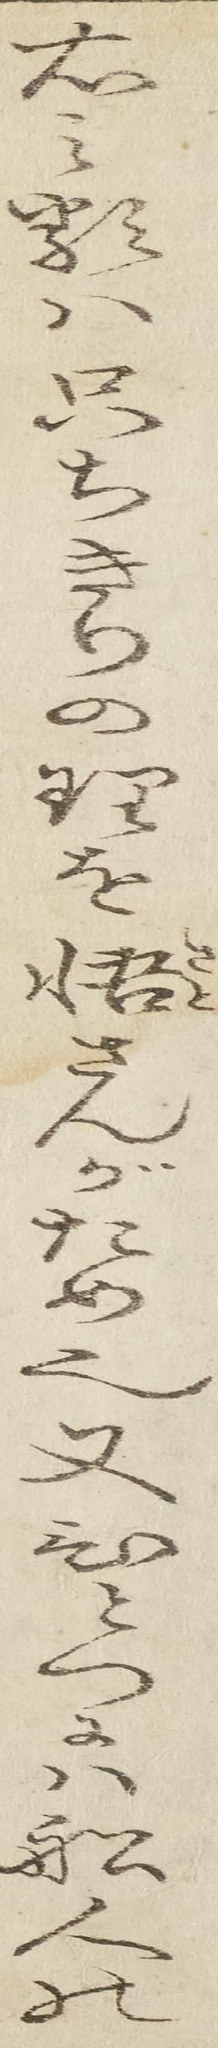右之類は只ちきりの理を悟さんがため也又ひとつは船人の
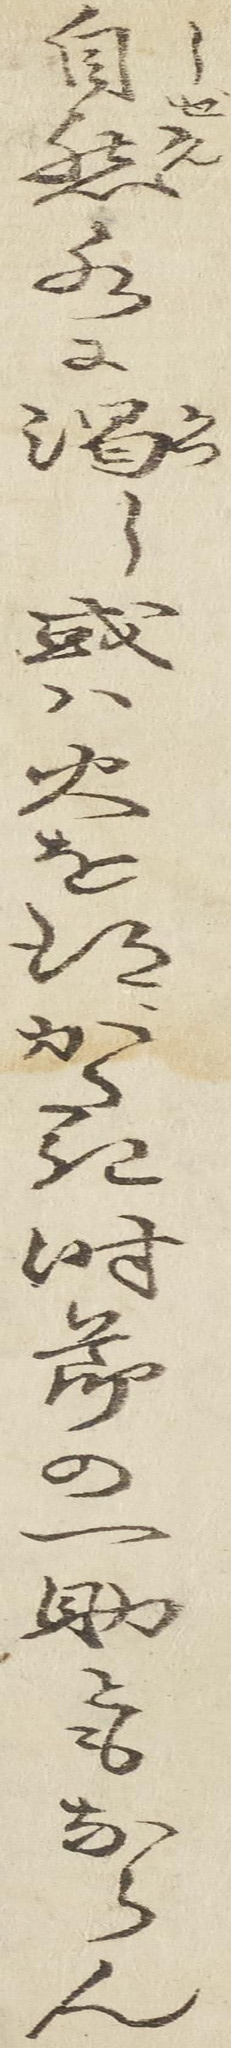自然水に渇し或は火を得かたき時節の一助ともならん
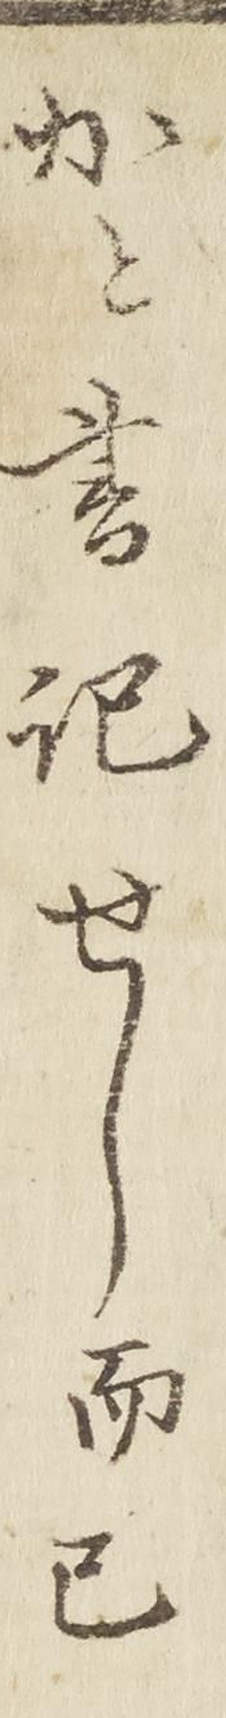かと書記せし而已
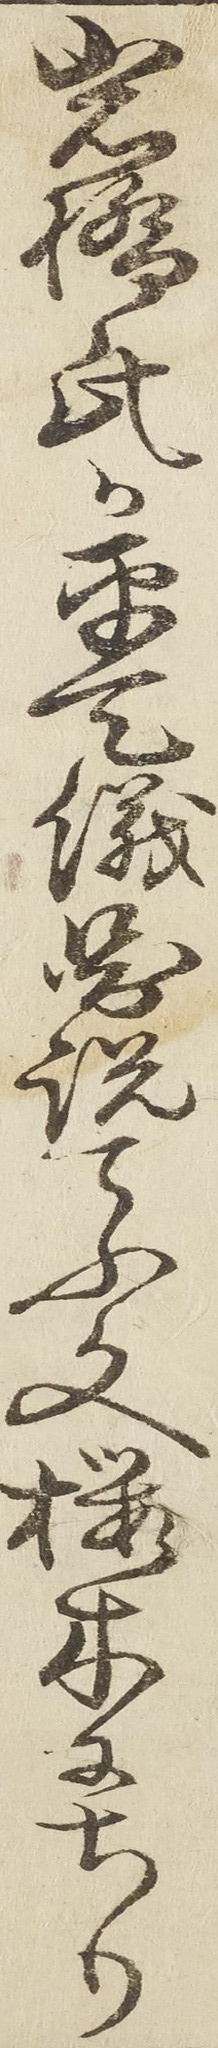岩橋氏か平天儀図説てふ又桜木にちり
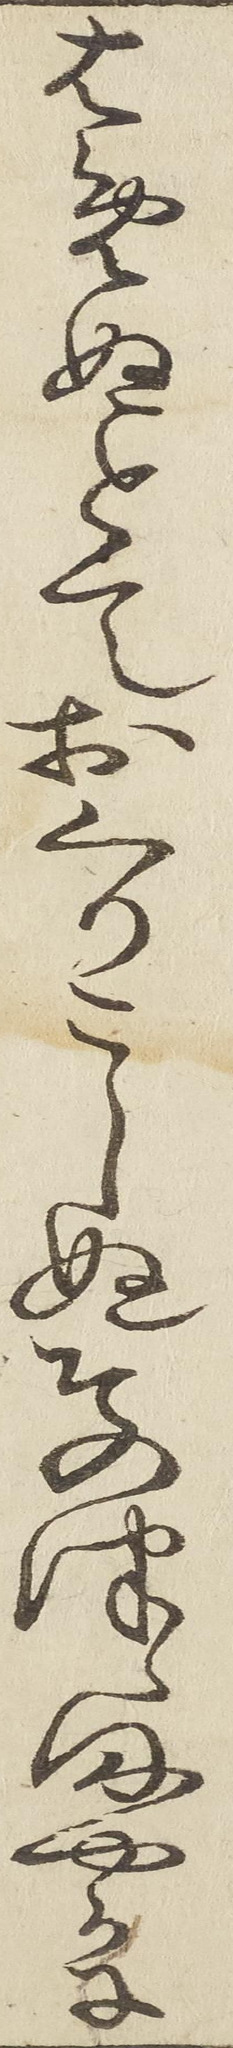はめぬとておくりこしぬそのつゝまやかに
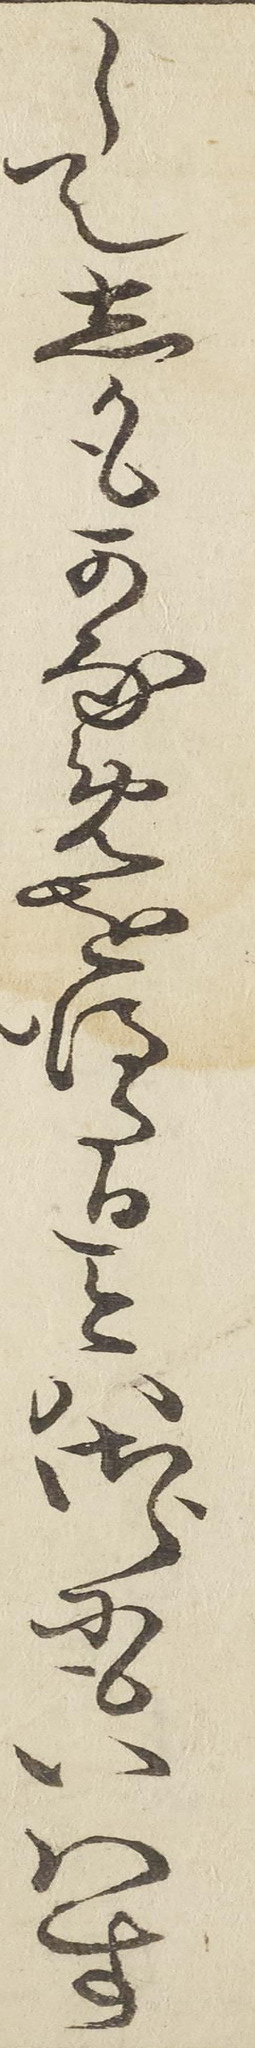してしかもかなめを得たることはさらにもいはす
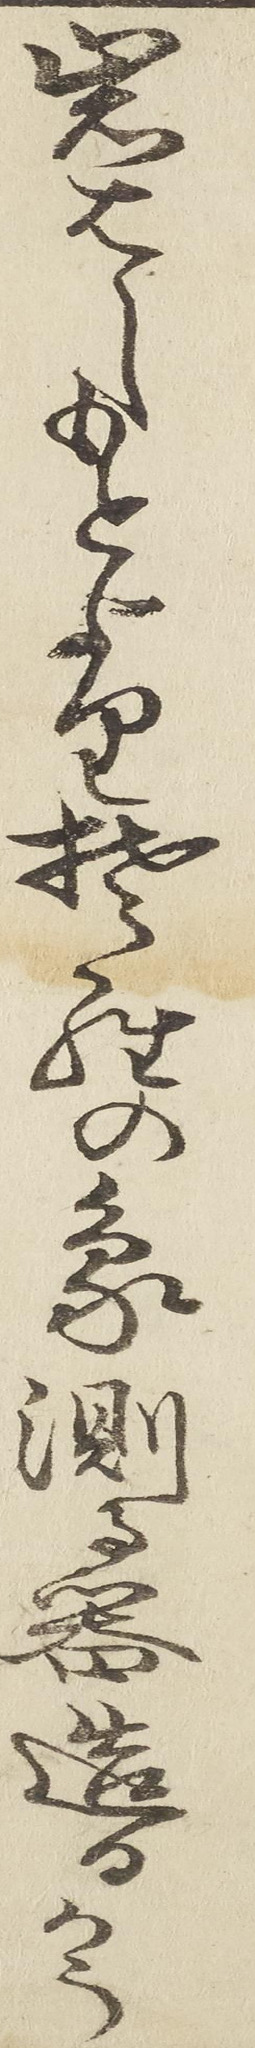岩はしもとよりそらの象測る器造るかう
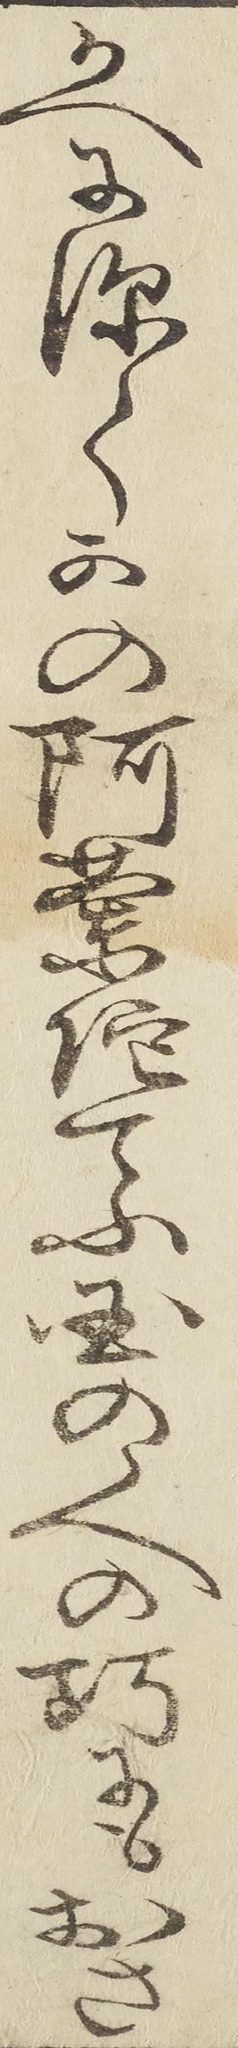かへに深くかの阿蘭陀てふ国の人の巧にもおさ
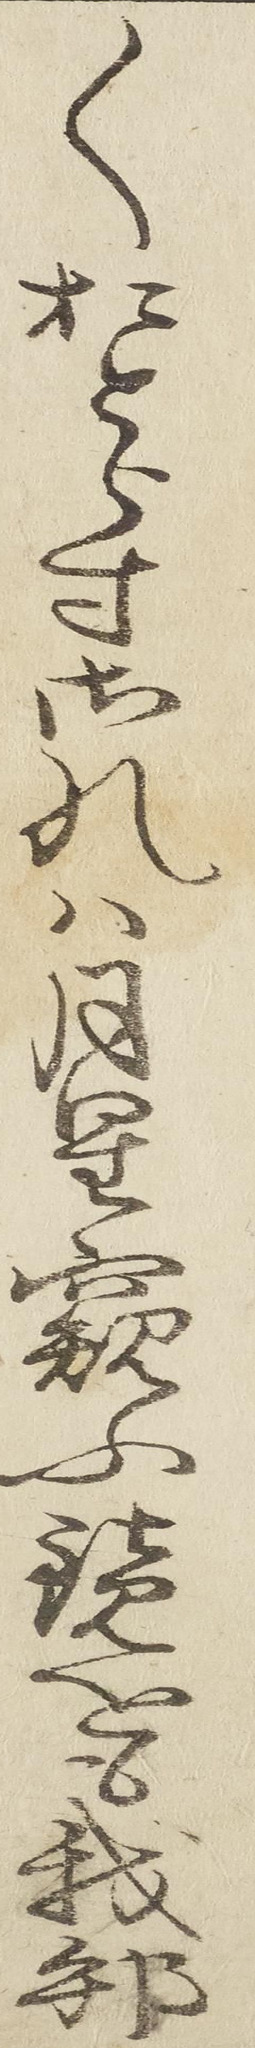〳〵おとらすされは月星窺ふ鏡をも我邦
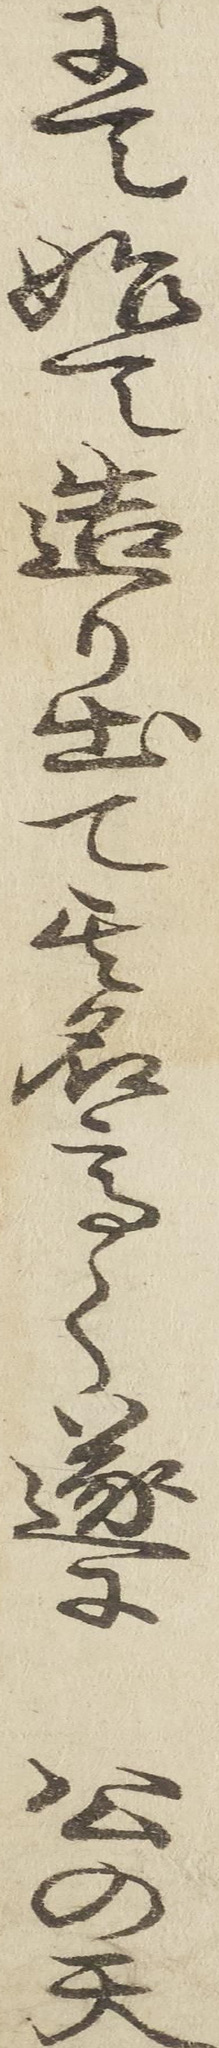にて始て造り出て其名高く遂に公の天
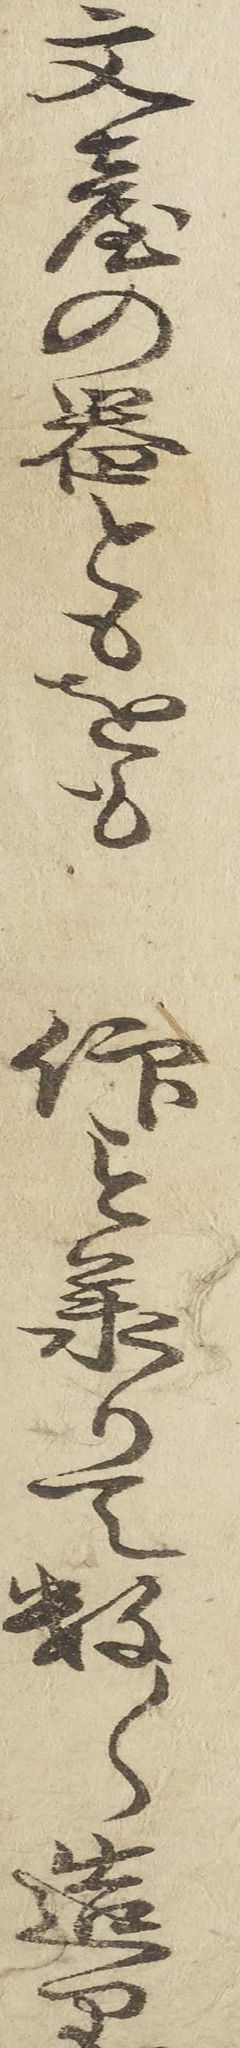文台の器ともをも仰こと承りて数〳〵造り

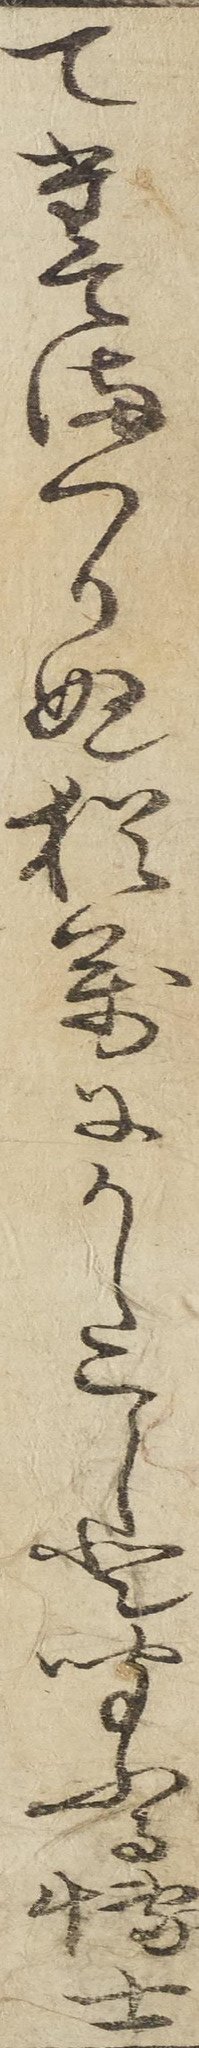てたてまつりぬ猶万にかしこしと聞ふる博士
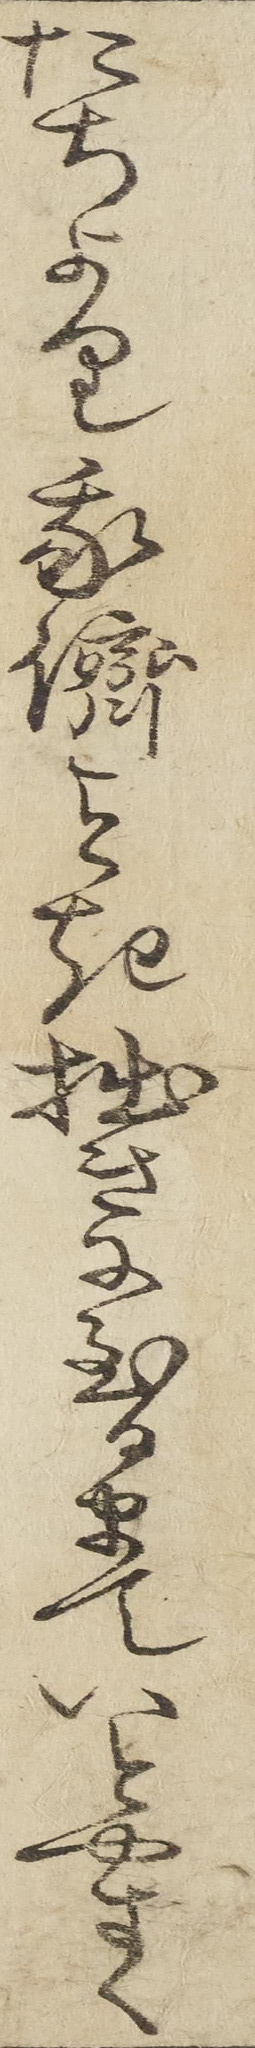たちより我儕ことき拙きに至るまていとやすく
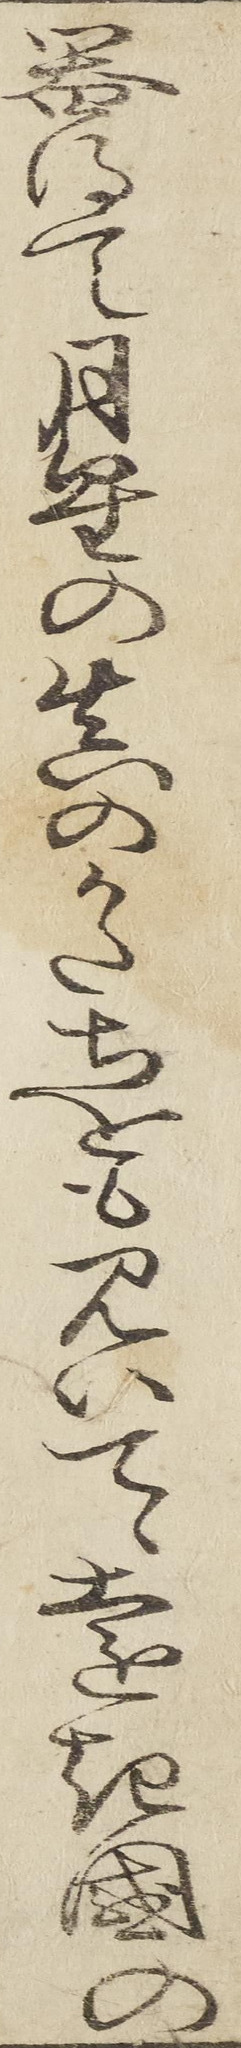器得て月星の真のかたちをも見いてゝ遠き国の
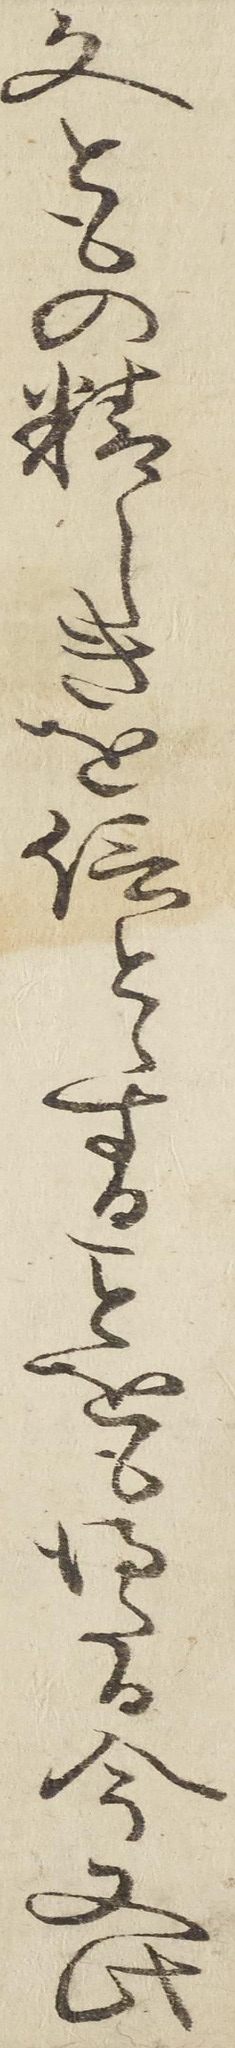文ともの精しきを信とすることをも得たる今又此
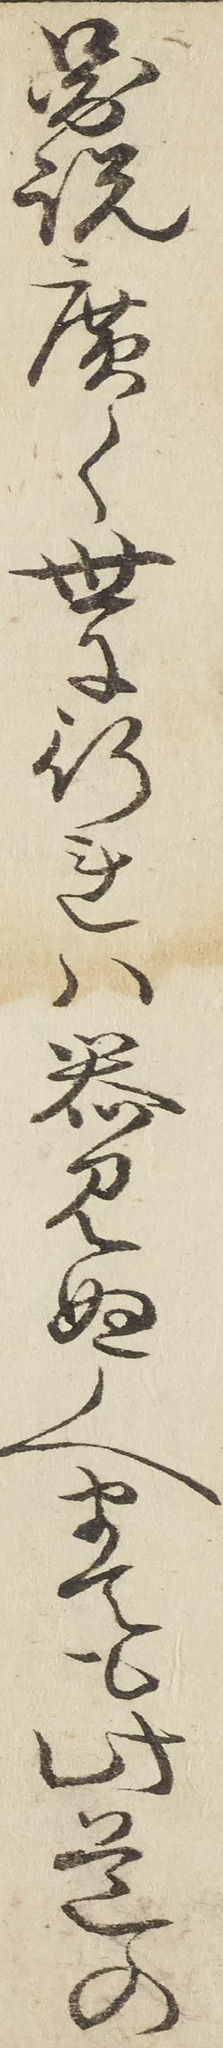図説広く世に行れは器見ぬ人まても此道の
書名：平天儀圖解
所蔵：東京大学地震研究所図書室 Earthquake Research Institute Library, The University of Tokyo, JAPAN
